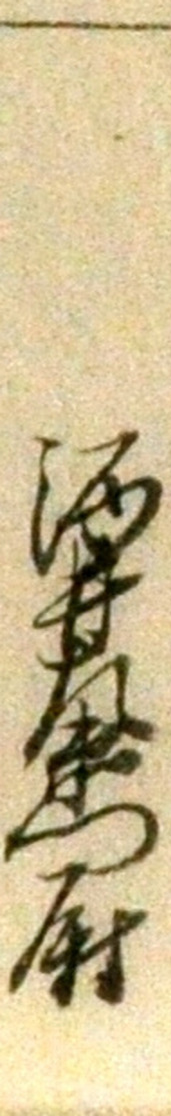酒井左衛門尉
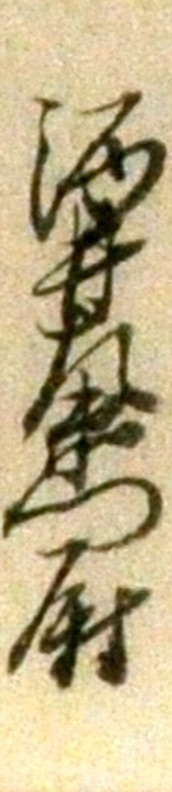酒井左衛門尉
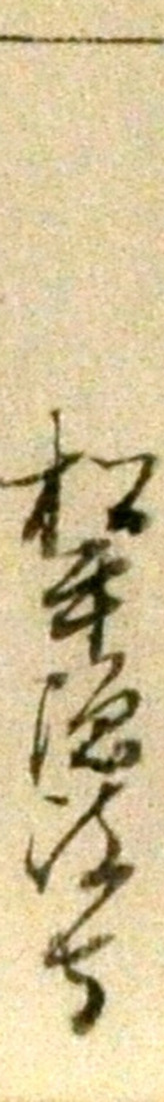松平隠岐守
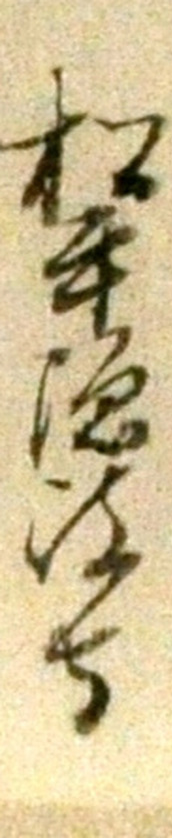松平隠岐守
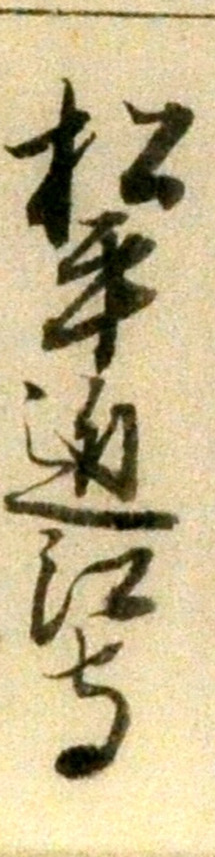松平近江守
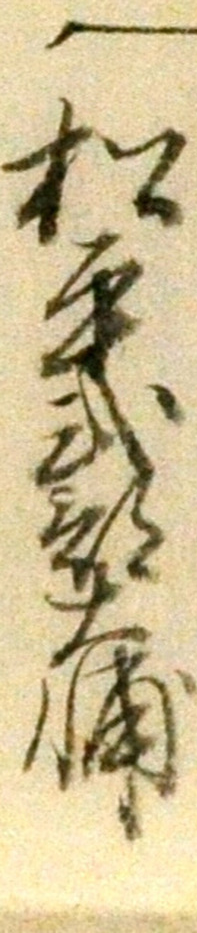松平式部大輔
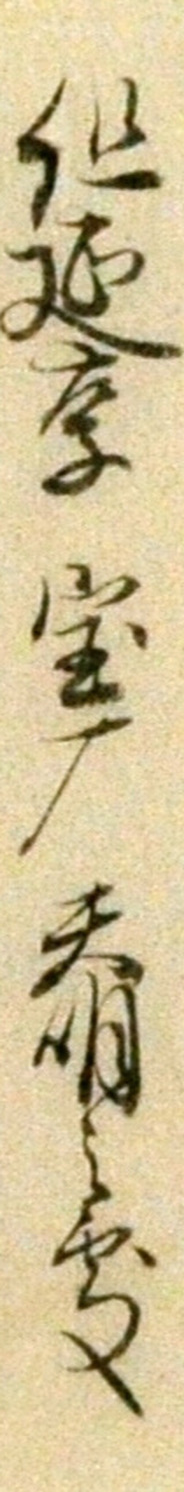但延享宝暦天明之処
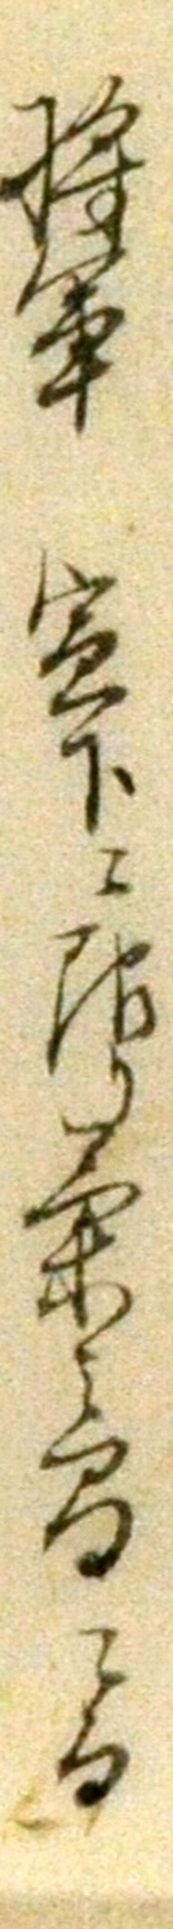将軍宣下ニ限り菊之間ニ而

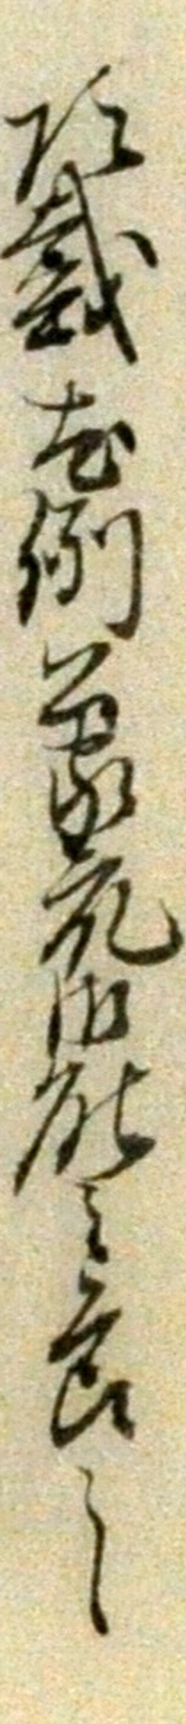頂戴尤例公家衆御能之節之
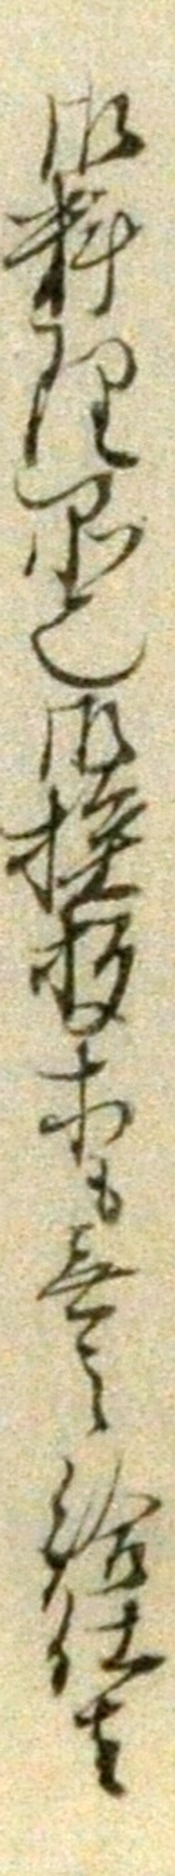御料理品也御挨拶等も無之給仕は
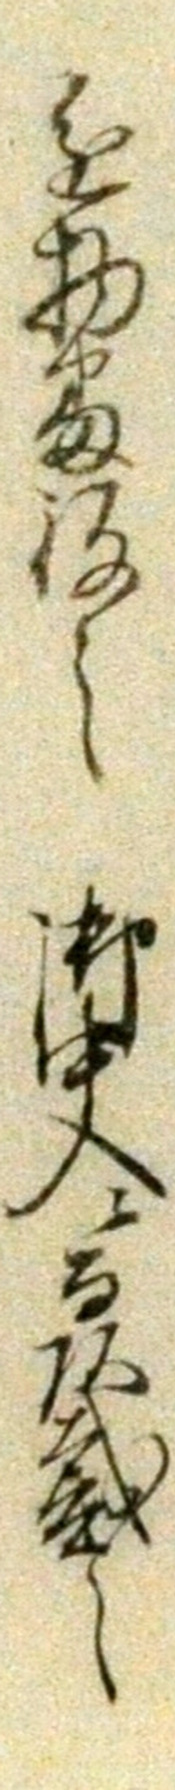進物番致之御中入ニ而頂戴之
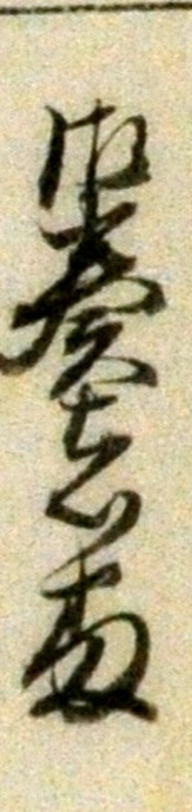御奏者盤
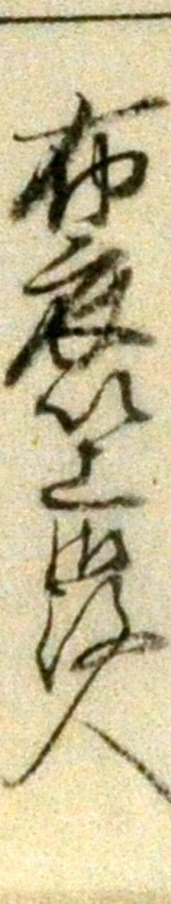布衣以上御役人
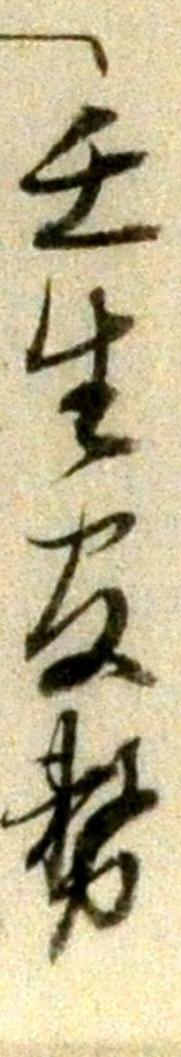壬生官務
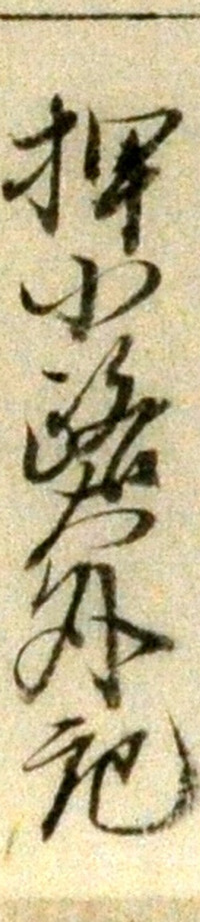押小路大外記
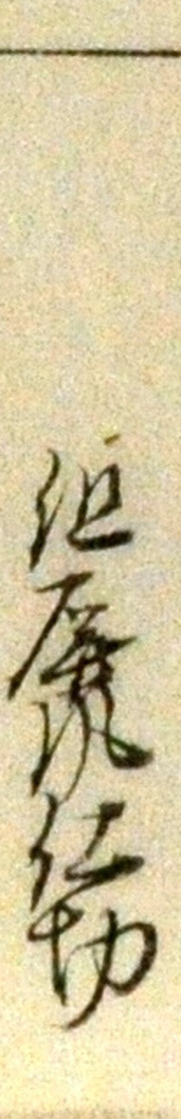但屏風仕切
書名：御馳走御能ノ節ノ留外
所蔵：伊那市立高遠町図書館・合同会社AMANE
